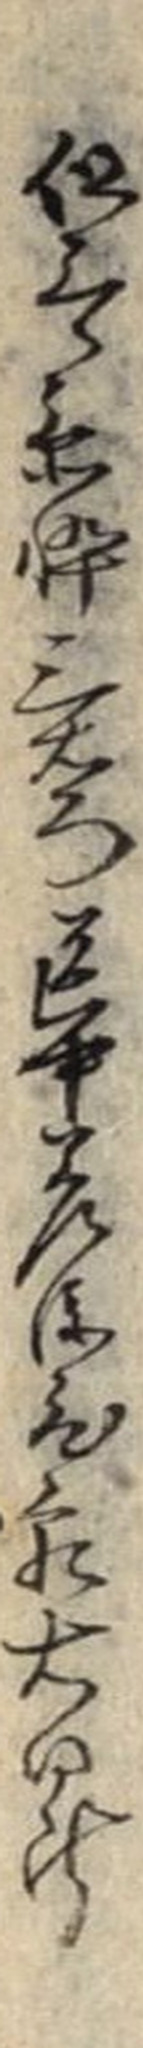但三郎兵衛倅三右衛門道中差添度願右同断
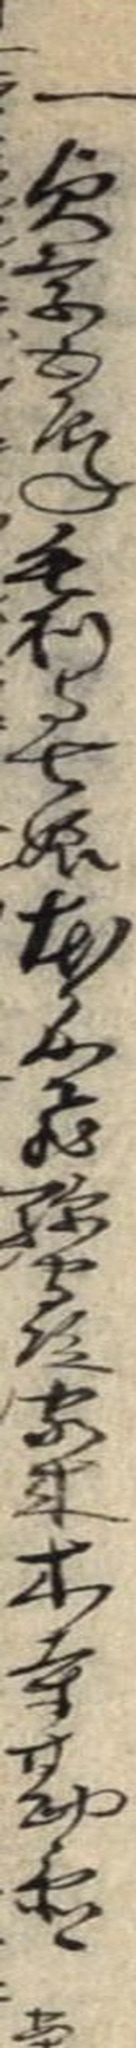一貞享五辰年毛利与七娘本多飛騨守殿家来木寺勘兵衛へ
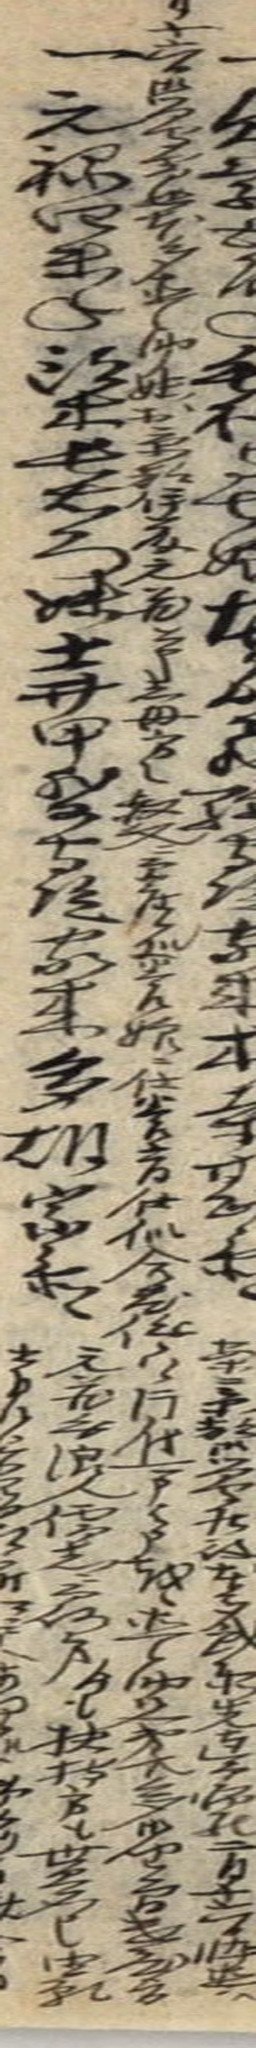一元禄四未年鈴木長右衛門妹土井甲斐守殿家来多胡宗兵衛へ
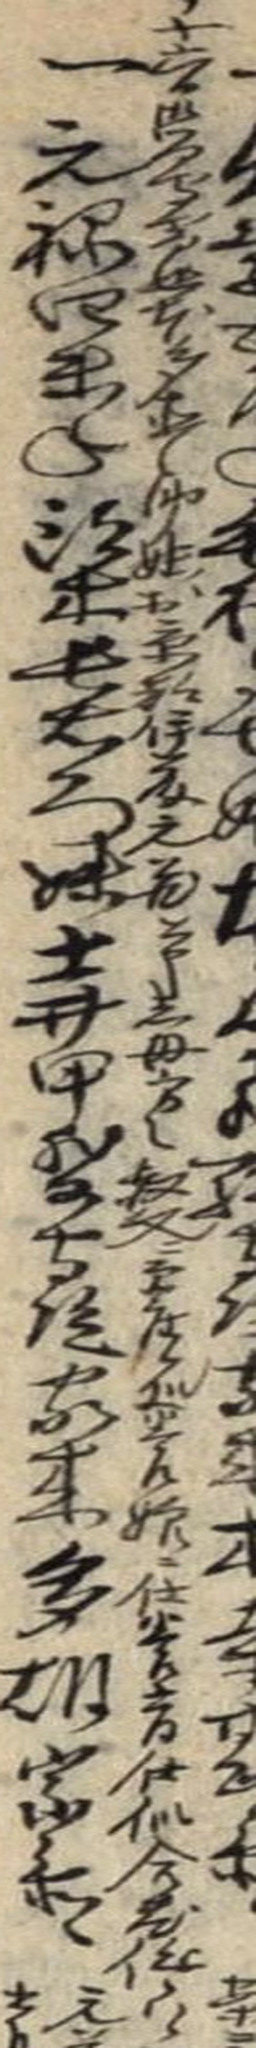一元禄四未年鈴木長右衛門妹土井甲斐守殿家来多胡宗兵衛へ
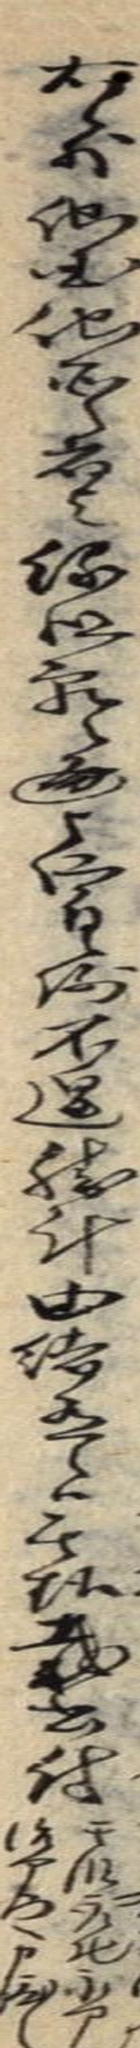右之外他国他処之者と縁組願之通被仰付候儀不遑勝計由緒有之ハ其趣載書付

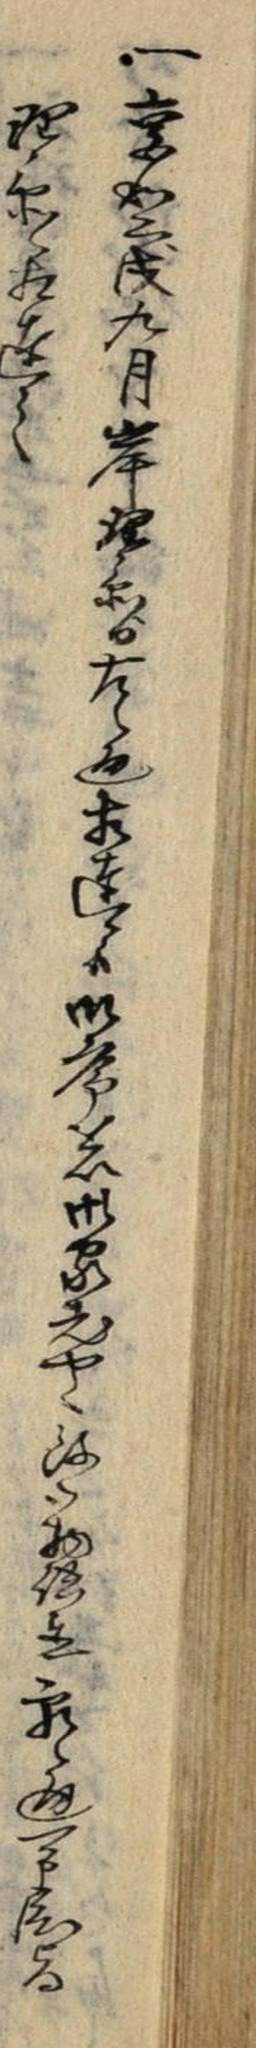一享和二戌九月岸理兵衛ゟ左之通相達候ニ付御序を以御家老中へ致御物語置願之通可申渡旨理兵衛へ相達之
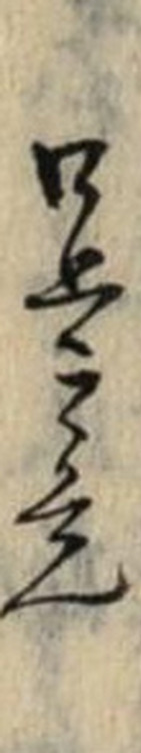口上之覚
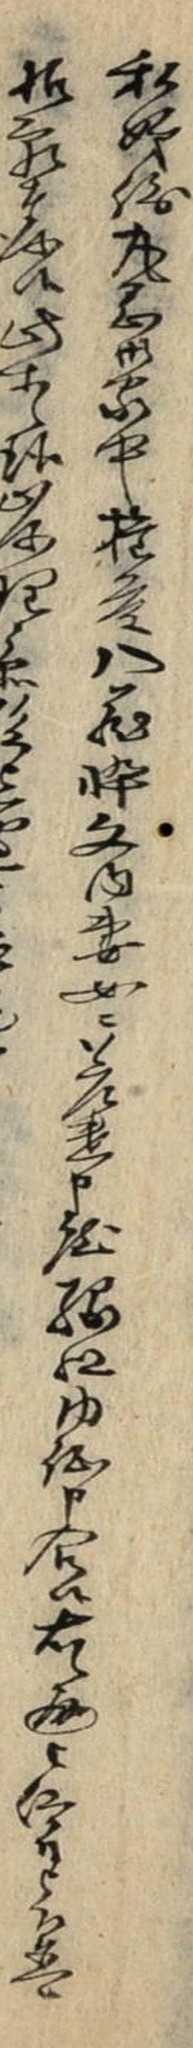私姉儀丸岡御家中権藤八蔵倅文内妻女ニ差遣申度縁組内証申合候右之通被仰付被下置候
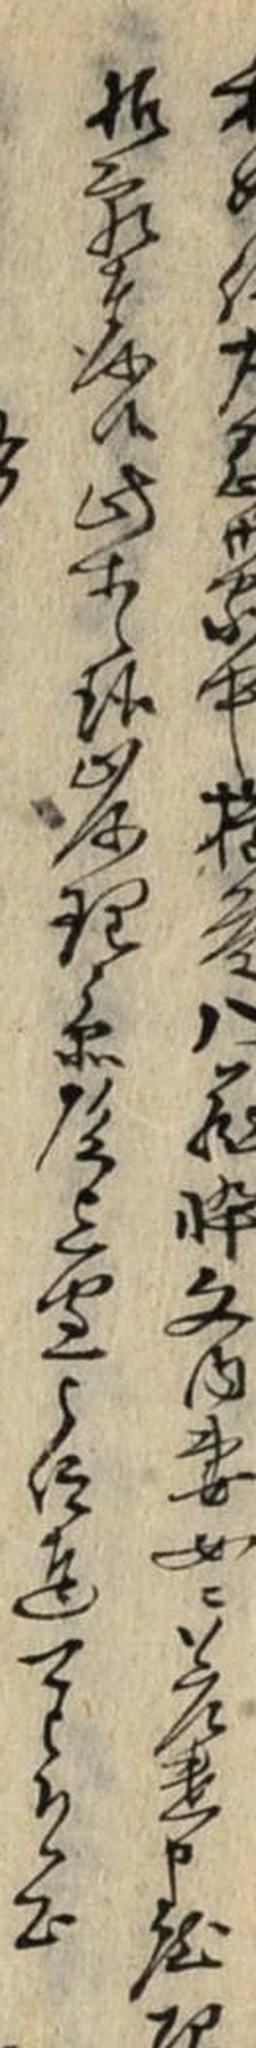様願奉存候此等之趣岸理兵衛殿迄宜被仰達可被下候以上
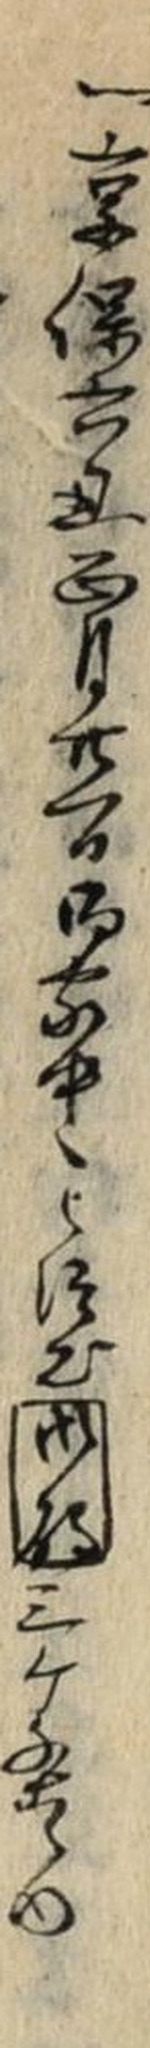一享保六丑正月廿一日御家中へ被仰出御触三ヶ条之内
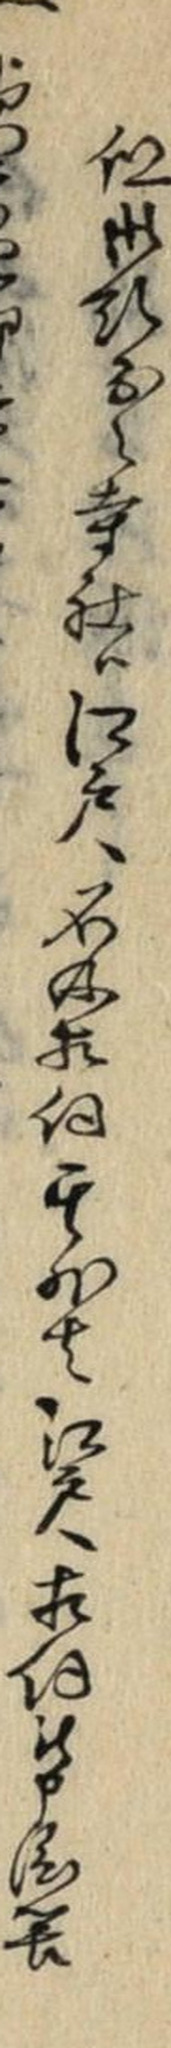但御領分之寺社ハ江戸へ不及相伺其外者江戸へ相伺被申渡筈
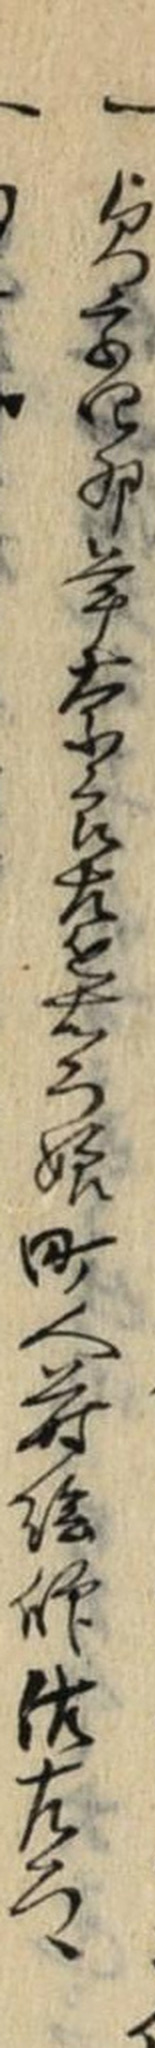一貞享四卯年奈良左近右衛門娘町人蒔絵師佐左衛門へ
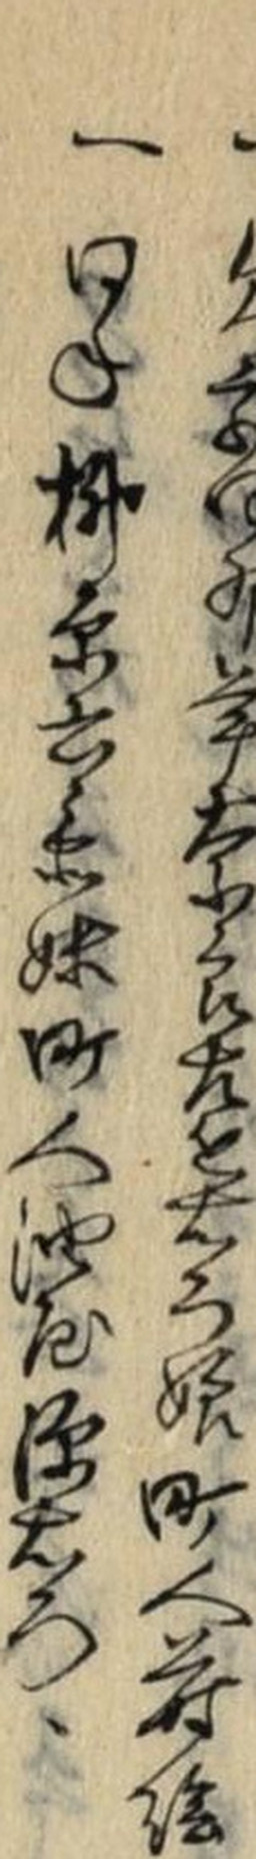一同年柳原六兵衛妹町人油屋源右衛へ
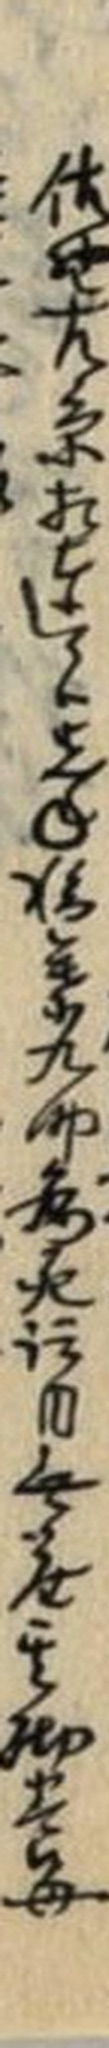佐野左京相達候ハ先年稲葉九助病死跡目無御座其砌養母
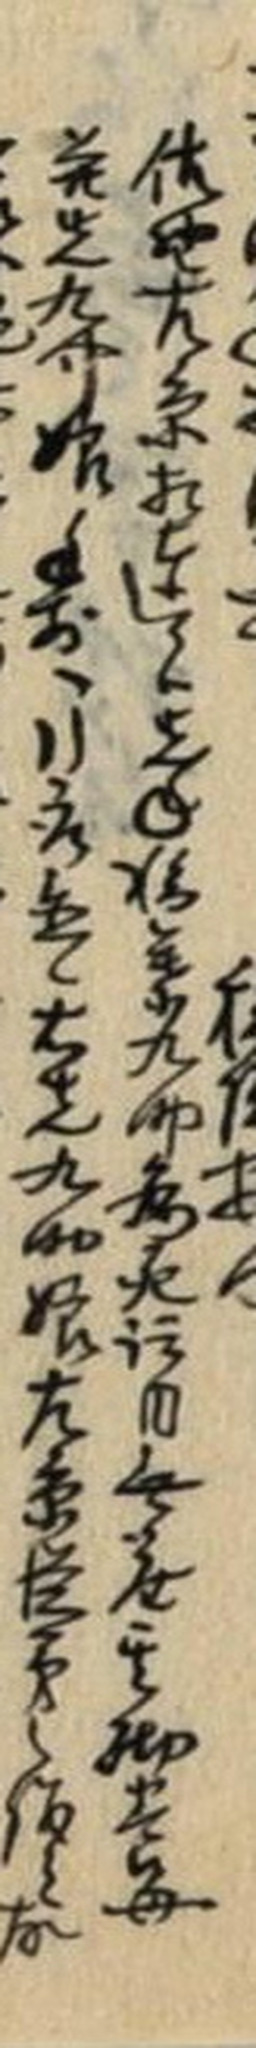并先九介之娘手前へ引取置候右先九助娘左京従弟之儀之故
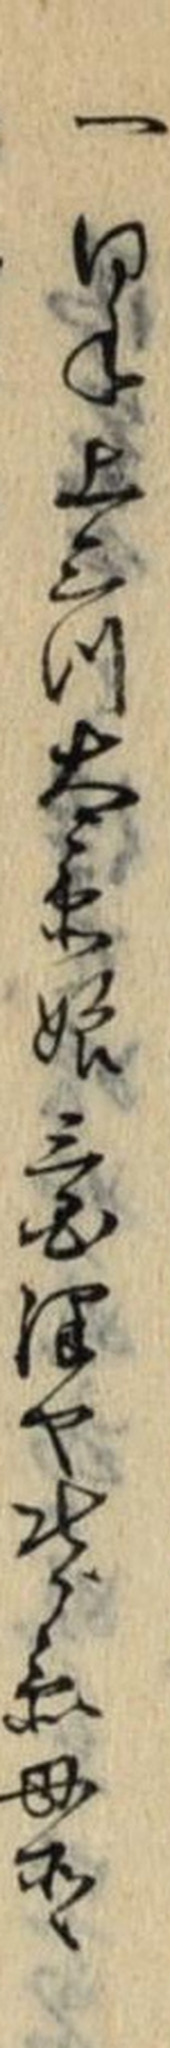一同年上三川太兵衛娘三国沢部次郎兵衛母所へ
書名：養子縁組之部
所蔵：福井県文書館 Fukui Prefectural Archives
